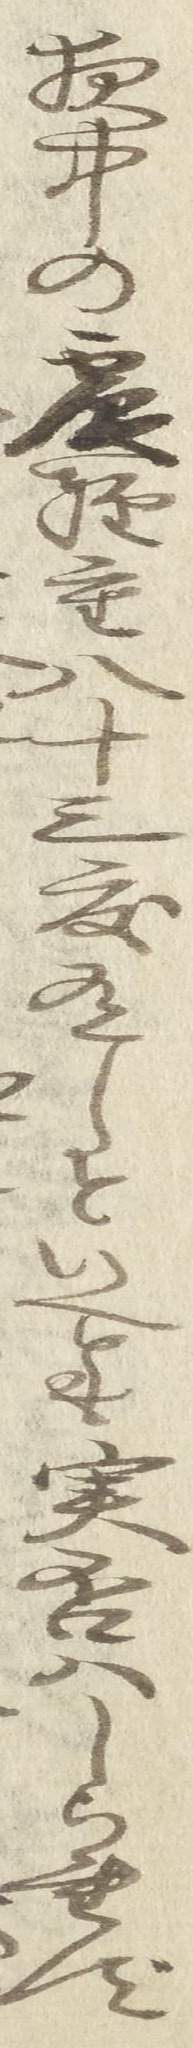夜中の震軽重八十三度有しといへとも実否はしられす
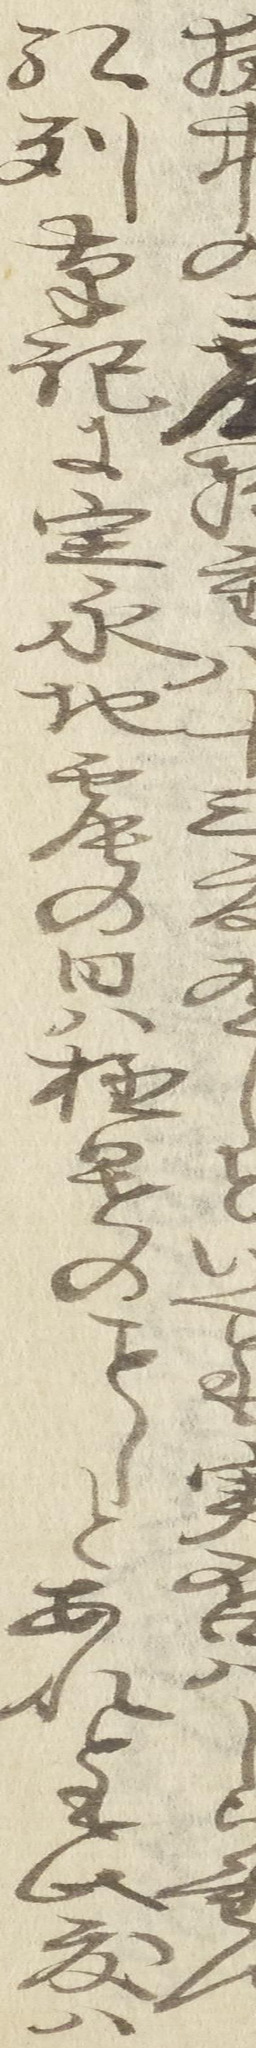弘列筆記に宝永地震の日は極暑のこととあれとも此度は
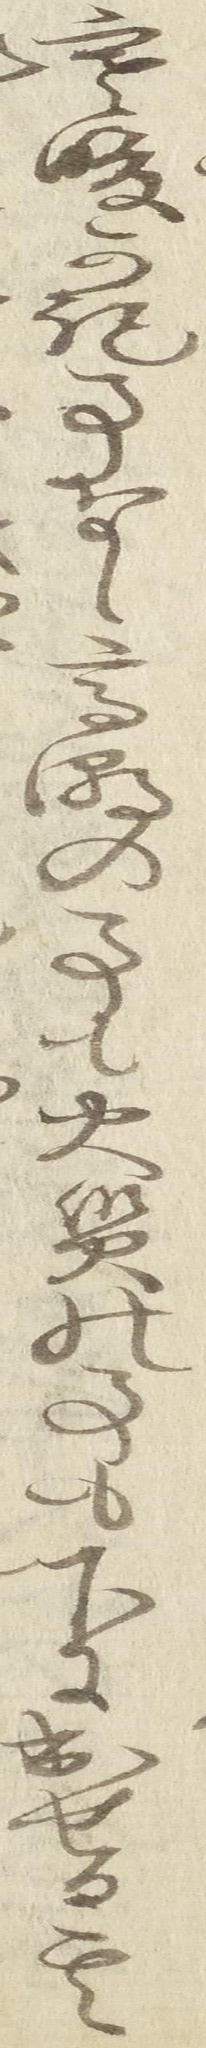寒暖可記事なし高潮の事も火災の事も下に出せる其
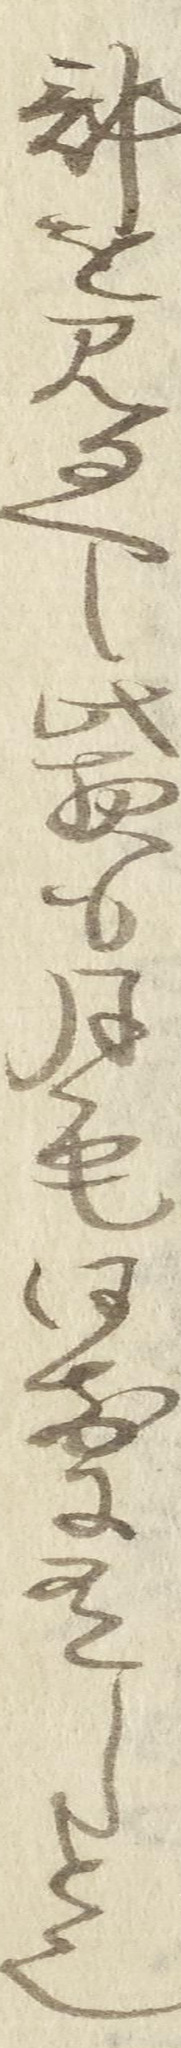部を見るヘし此夜も月色同前に有しと也
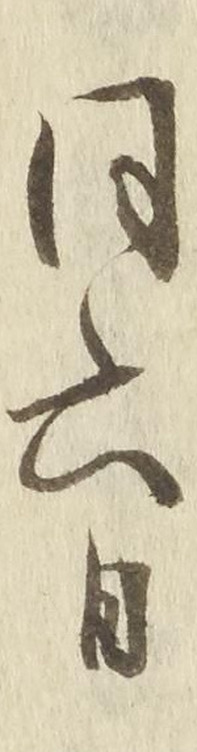同六日

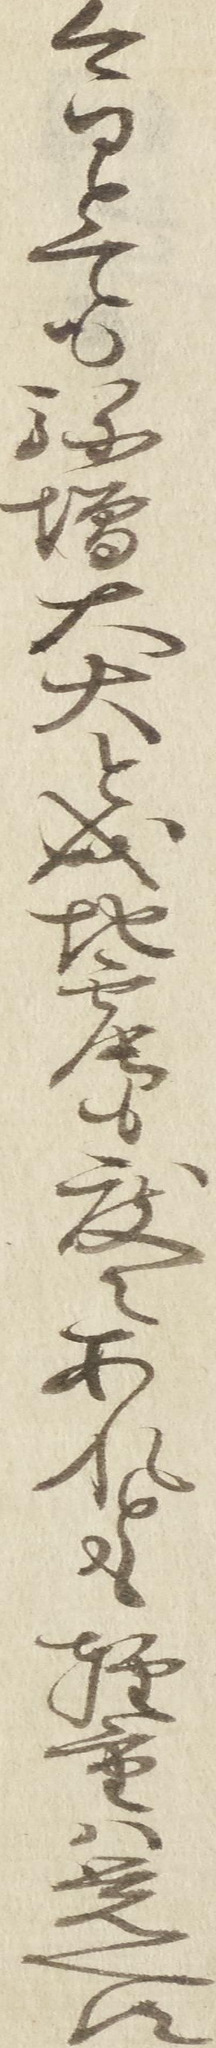今日とても弥増大小と成地震も度々あれとも軽重は覚へす
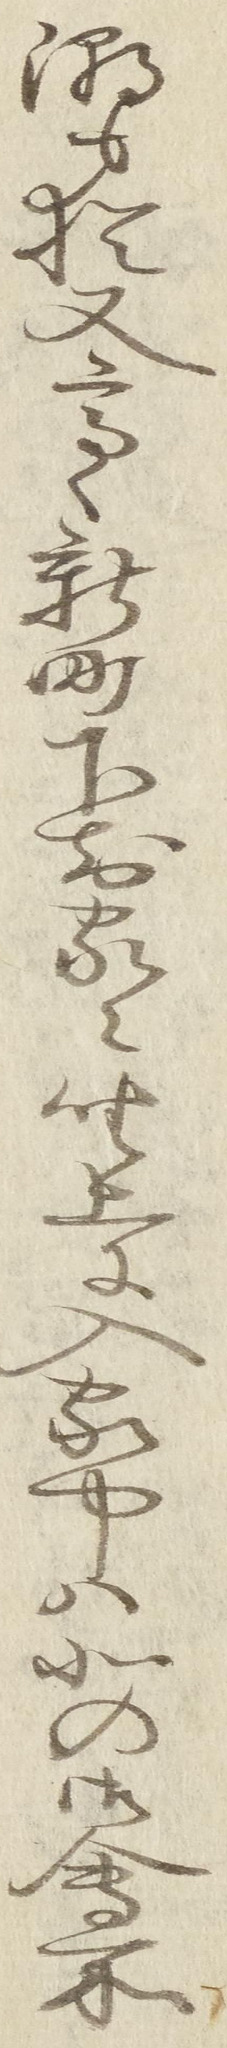潮も猶又高く新町下前家々座上に入家中は北の御会所
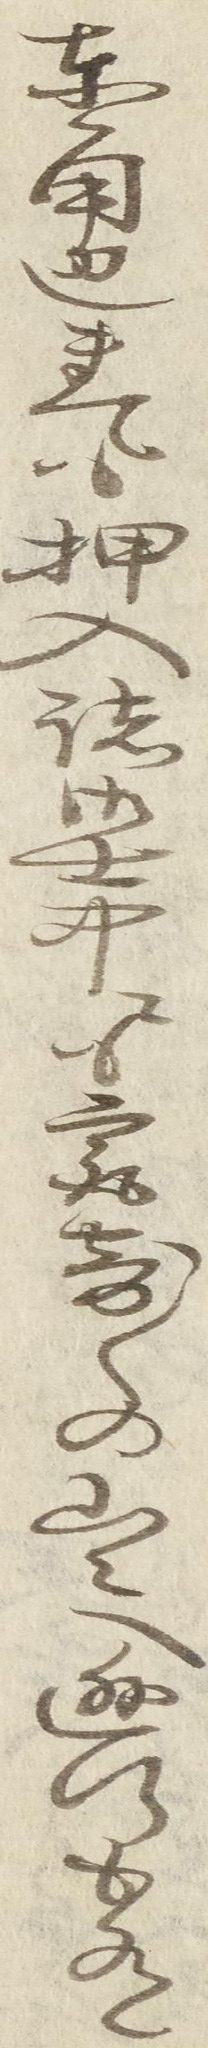東角辺まても押入諸御士中にも最寄の山々へ逃行も有
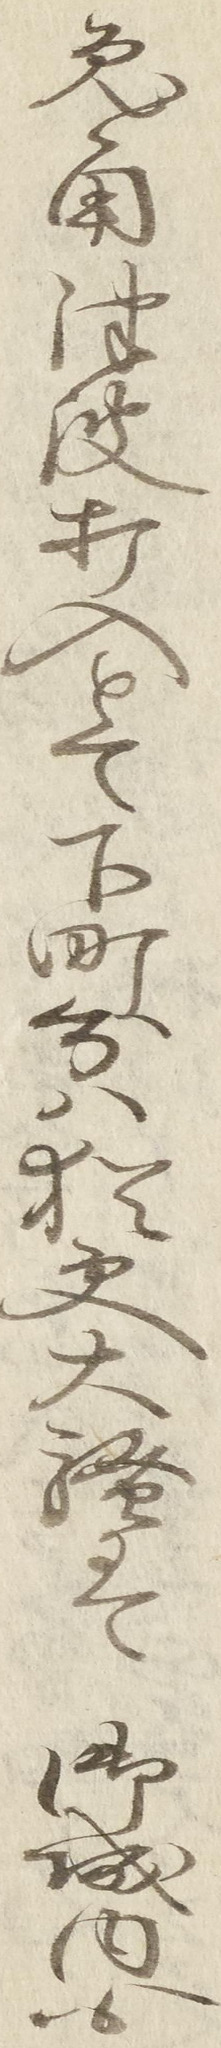兎角津波打入とて下町分は猶更大騒にて御城内へも
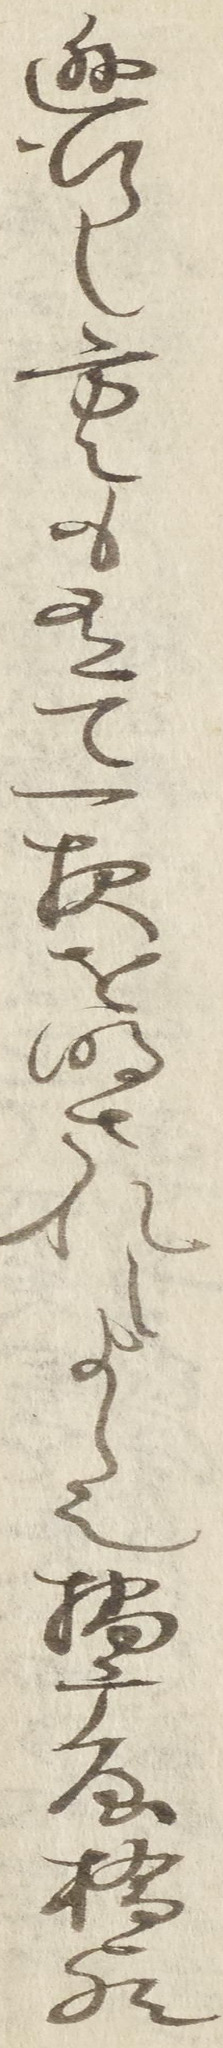逃行し方々も有て一夜を明されしよし也播磨屋橋歟
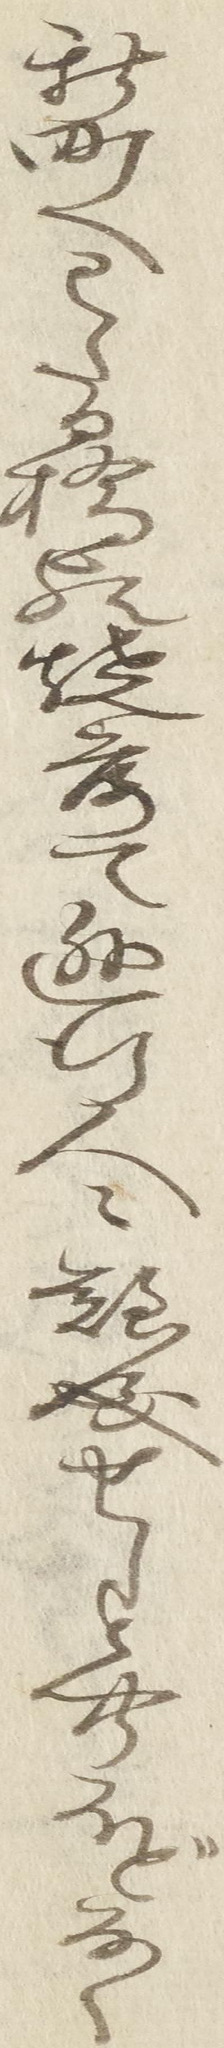新町へわたる橋歟焼落て逃行人々難儀せしと聞ほどなく
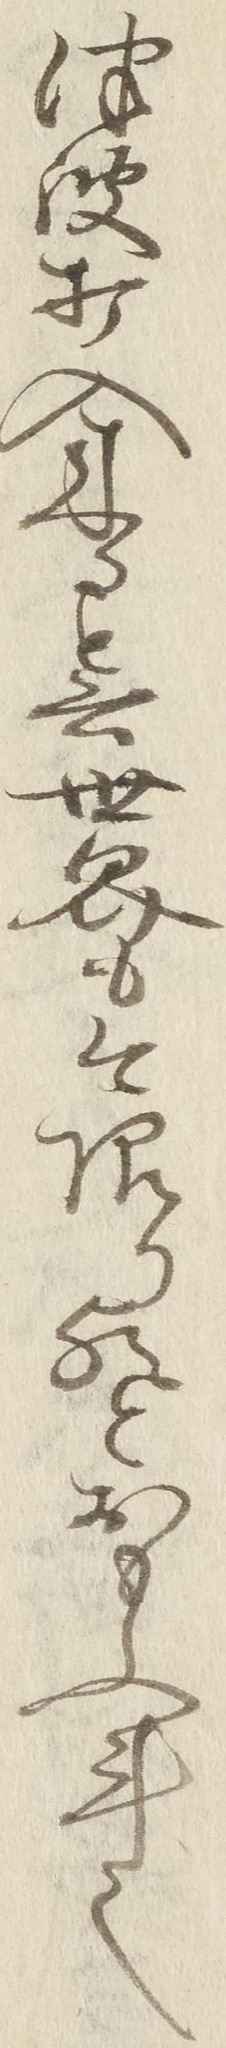津波打入来ると云世界も今限り歟とおもふ斗也
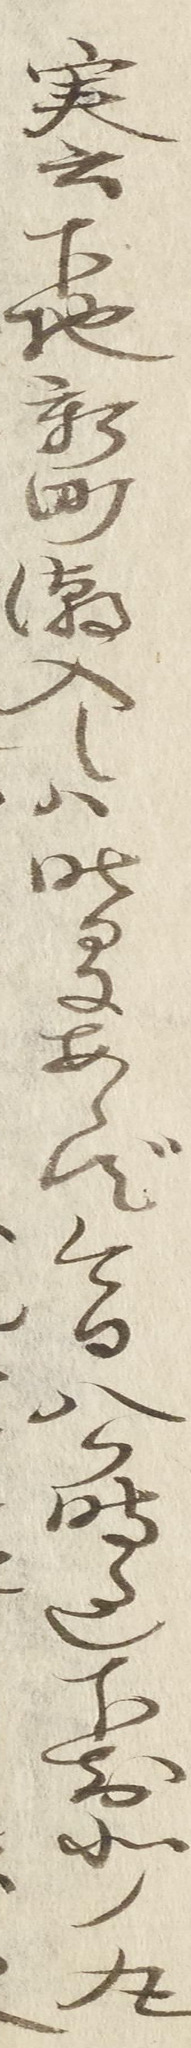実云下地新町潮入りしは昨日にあらず今日八ッ時過下前北の丸
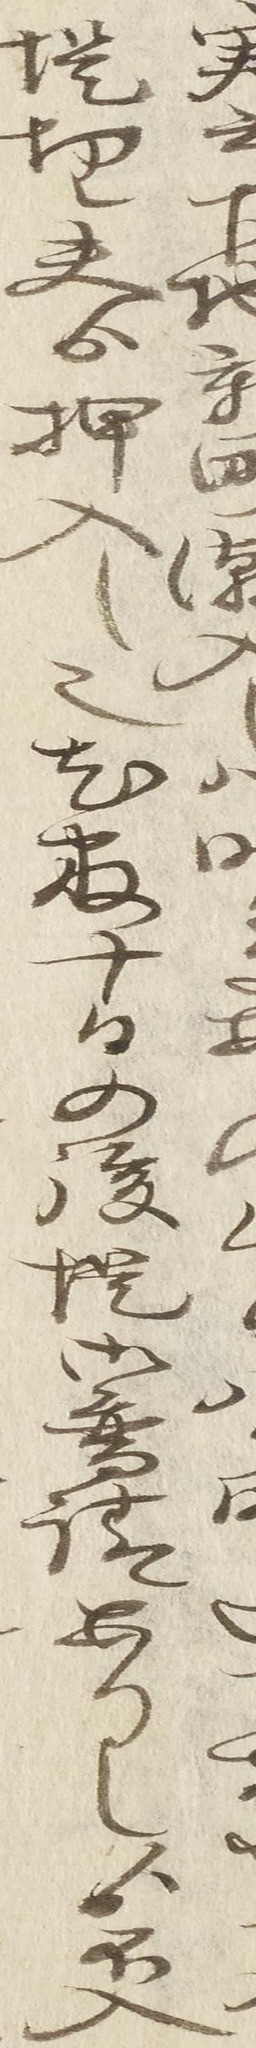堤切れ夫より押入し也尤数十日の後堤後普請ありしより不入
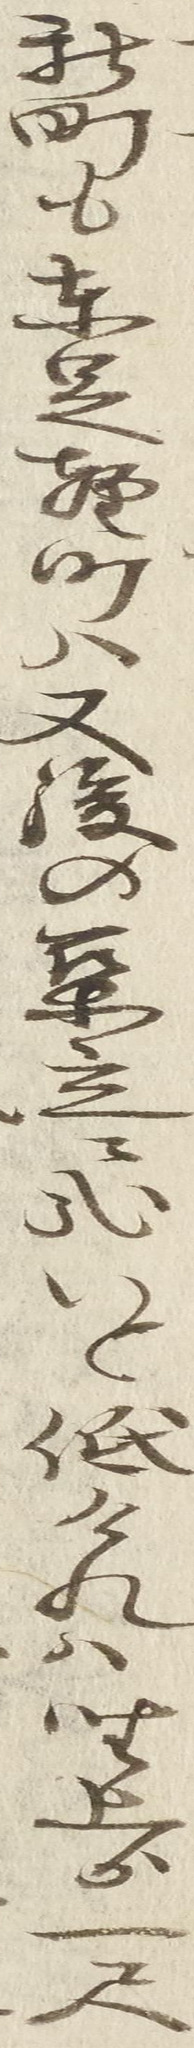新町も東足軽町は又後の築立に哉いと低けれは坐上より一尺
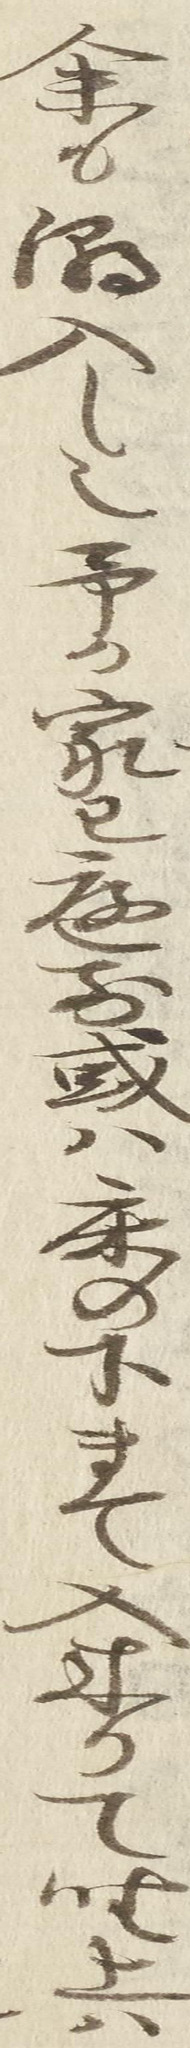余も潮入し候也予の家わ庭前或は床の下まで入来りて坐上は
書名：地震記　上
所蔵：東京大学地震研究所図書室 Earthquake Research Institute Library, The University of Tokyo, JAPAN
